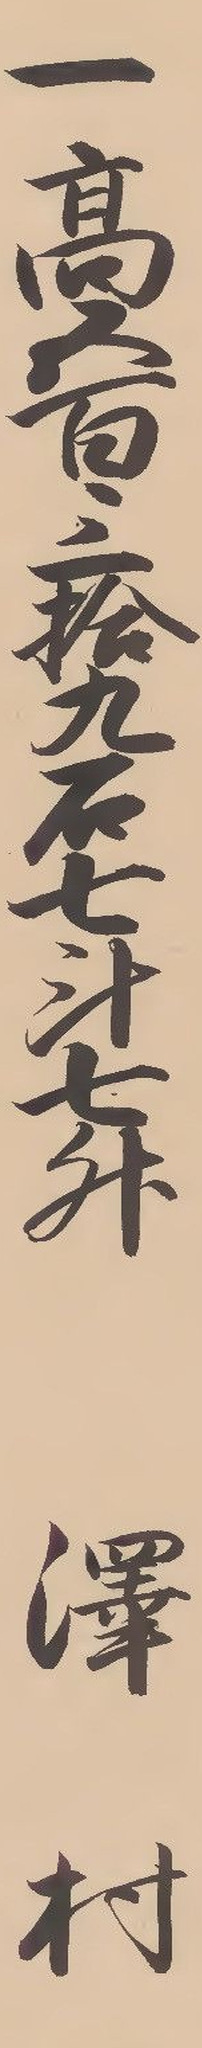一高五百三拾九石七斗七升沢村

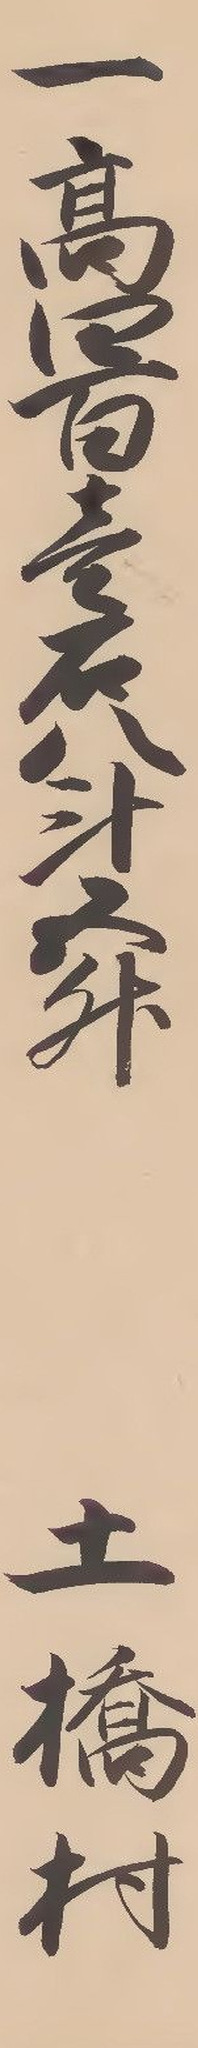一高四百壱石八斗五升土橋村
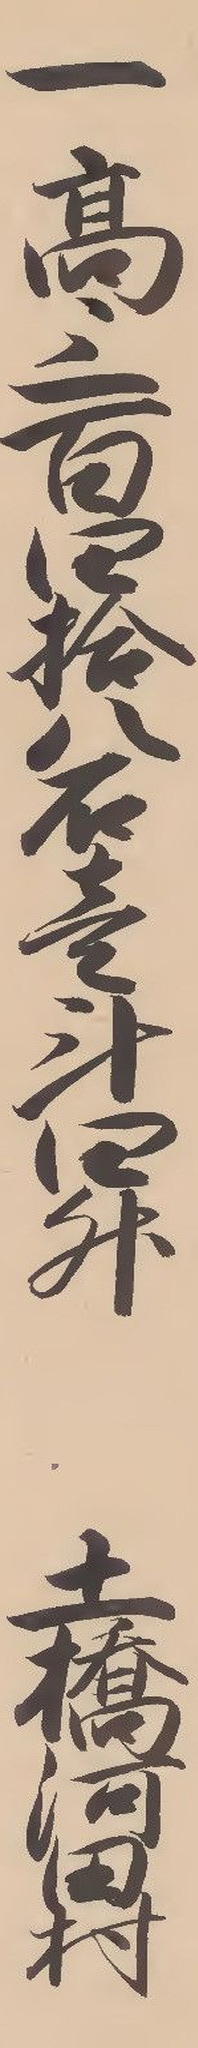一高三百四拾八石壱斗四升土橋河田村
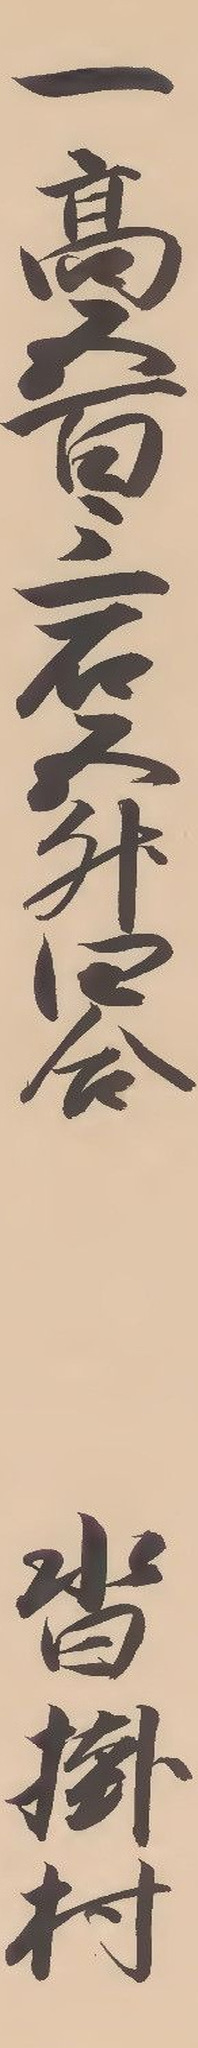一高五百三石五升四合沓掛村
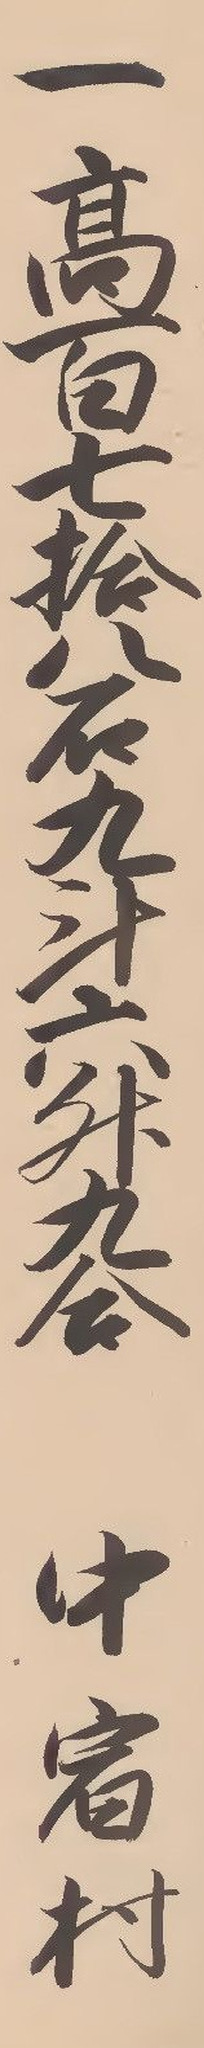一高百七拾八石九斗六升九合中宿村
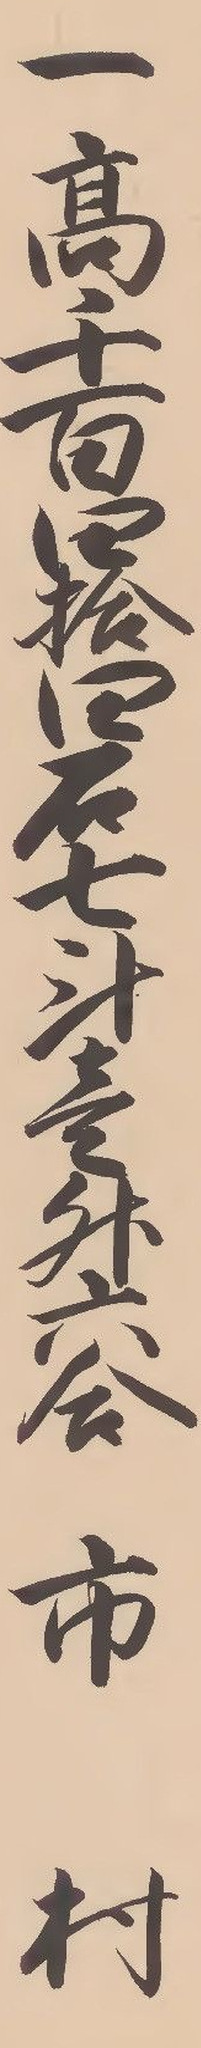一高千百四拾四石七斗壱升六合市村
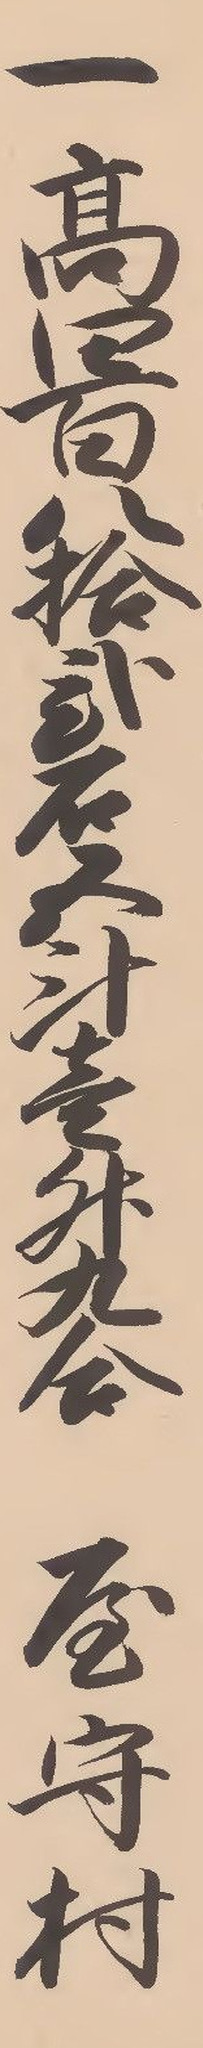一高四百八拾弐石五斗壱升九合屋守村

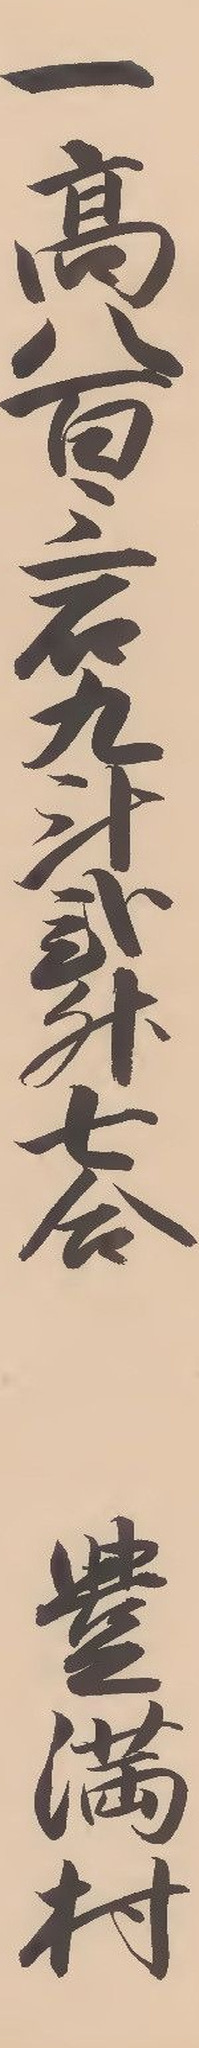一高八百三石九斗弐升七合豊満村
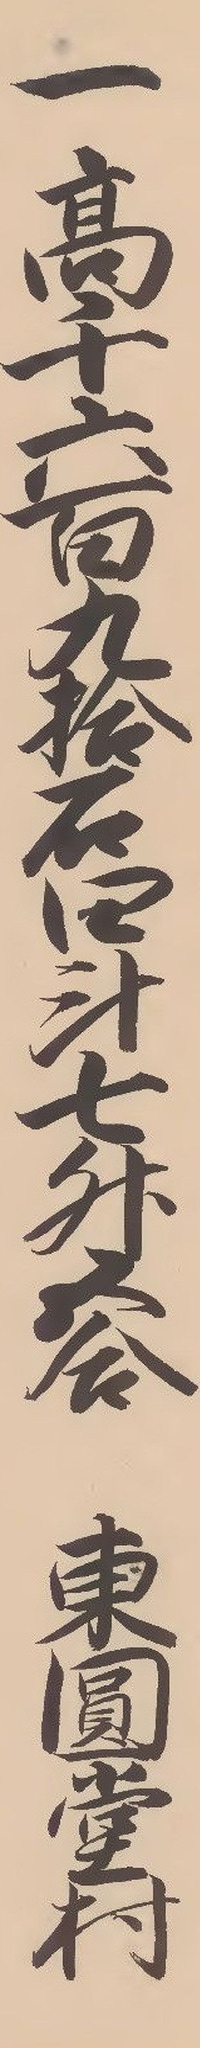一高千六百九拾石四斗七升五合東円堂村
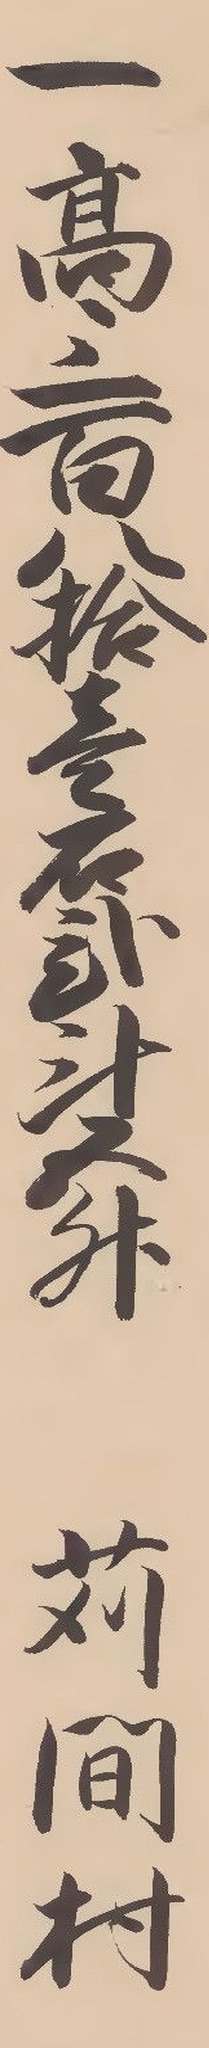一高三百八拾壱石弐斗五升苅間村
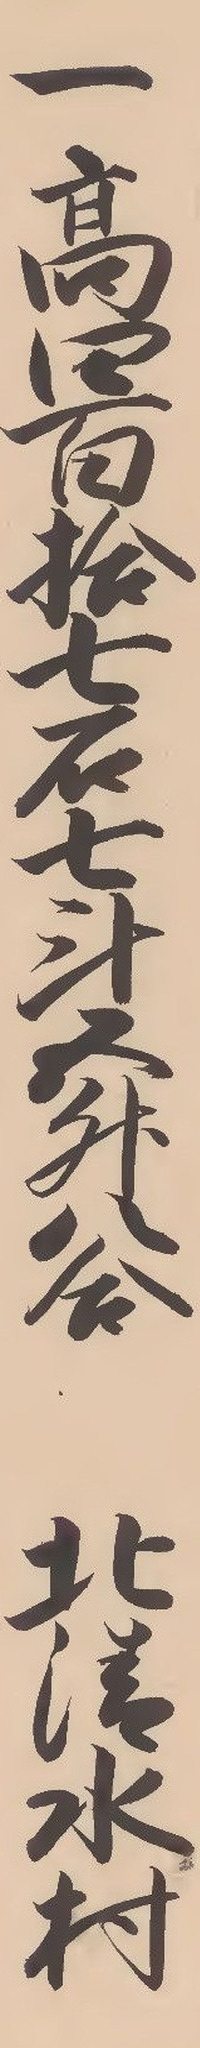一高四百拾七石七斗五升八合北清水村
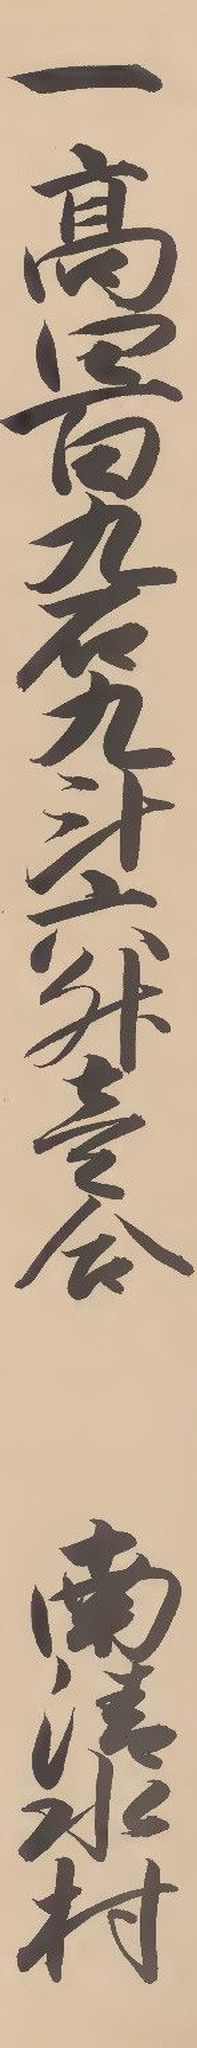一高四百九石九斗六升壱合南清水村
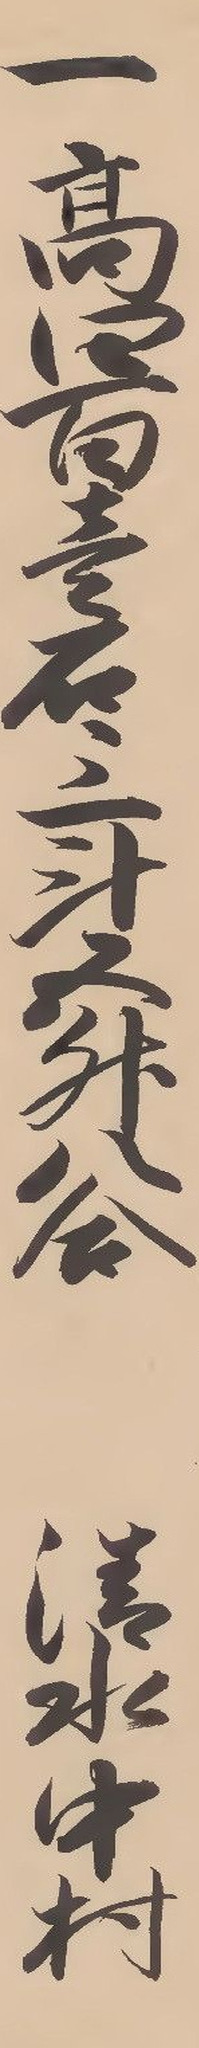一高四百壱石三斗五升八合清水中村
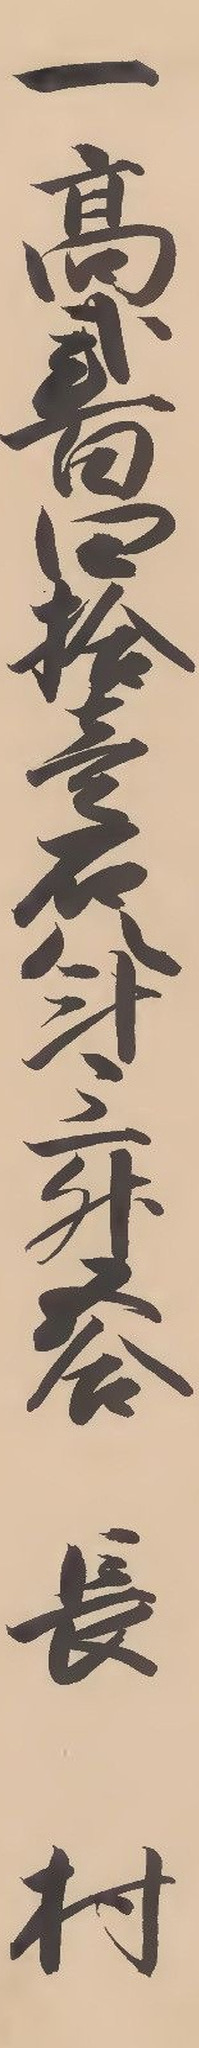一高弐百四拾壱石八斗三升五合長村

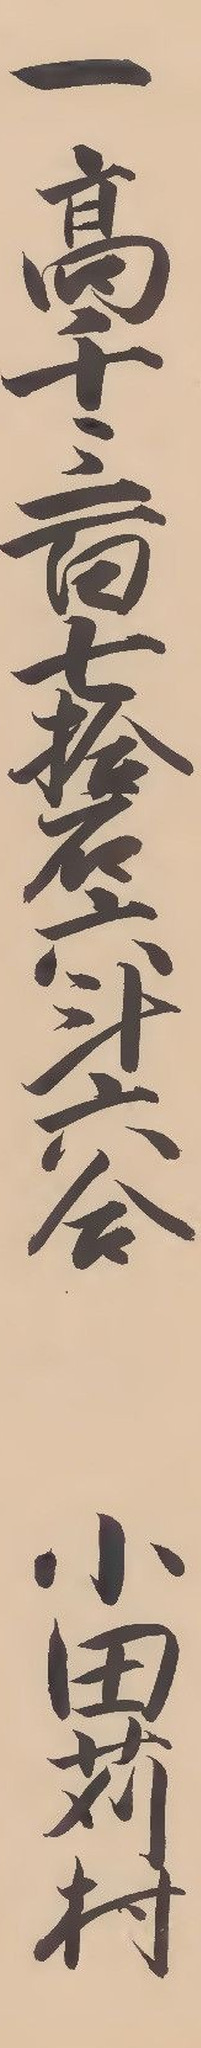一高千三百七拾石六斗六合小田苅村
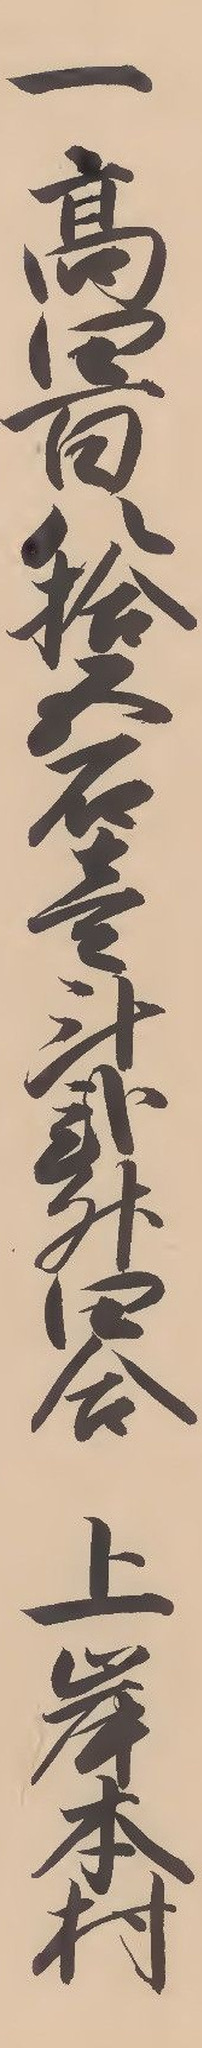一高四百八拾五石壱斗弐升四合上岸本村
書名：近江国郷帳
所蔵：国立公文書館 National Archives of Japan
